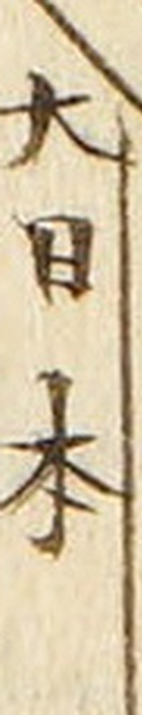大日本
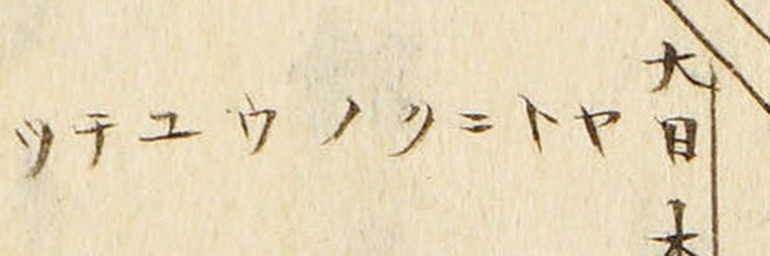ヱツチユウノクニトヤ
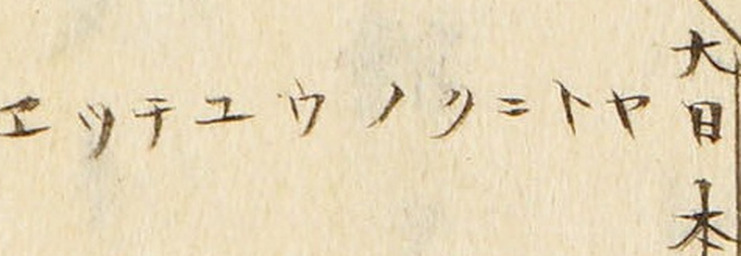ヱツチユウノクニトヤ
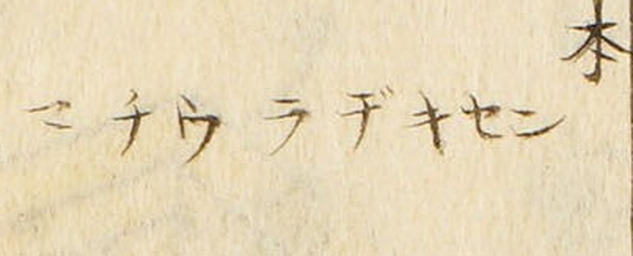ニキマチウラヂキセン
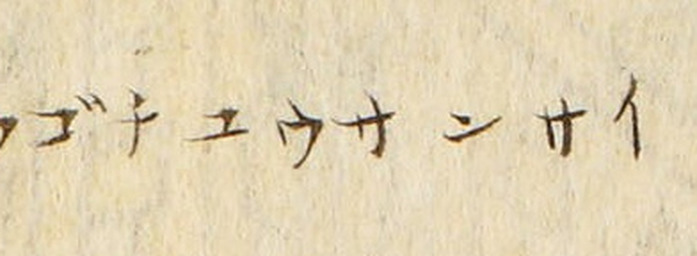ロウゴチユウサンサイ
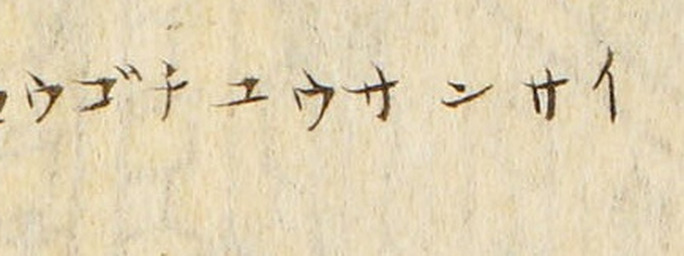ロウゴチユウサンサイ
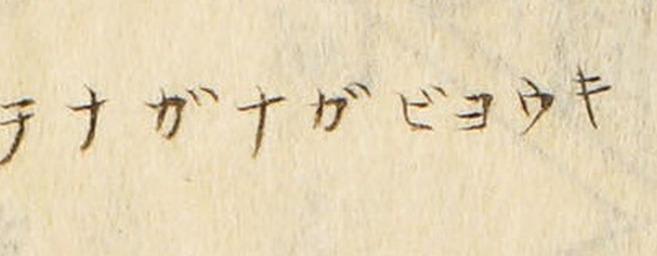キテナガナガビヨウキ
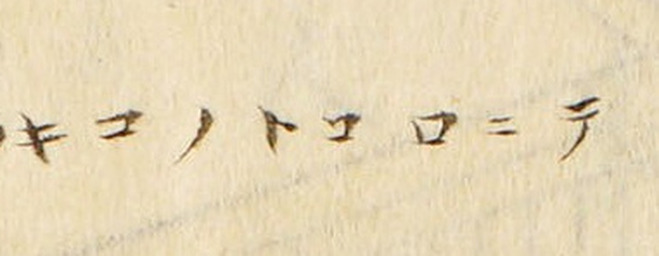ニツキコノトコロニテ
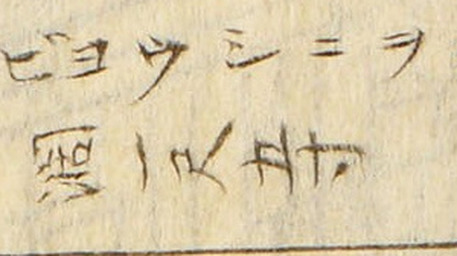濶一尺五寸
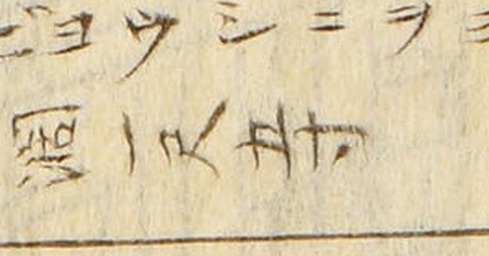濶一尺五寸
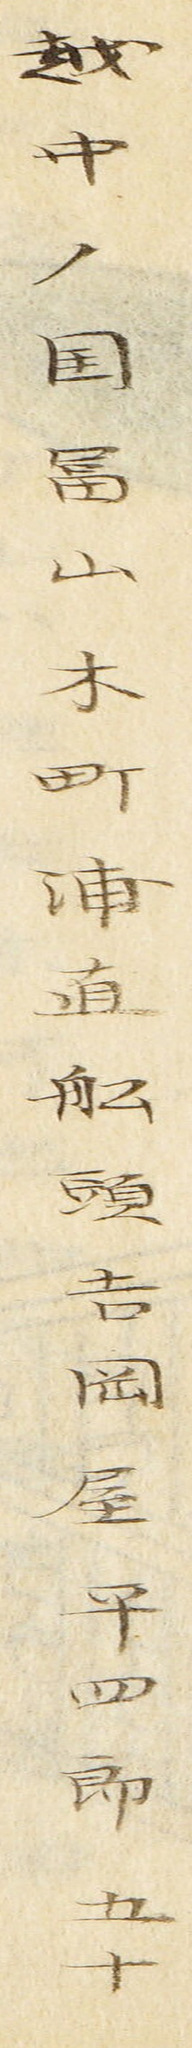越中ノ国富山木町浦直船頭吉岡屋平四郎五十
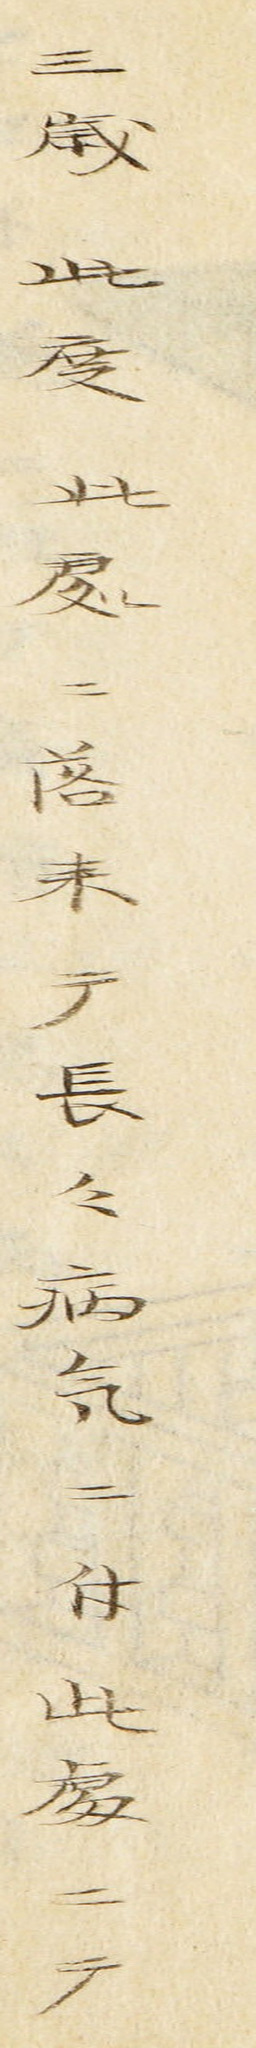三歳此度此処ニ落来テ長々病気ニ付此処ニテ

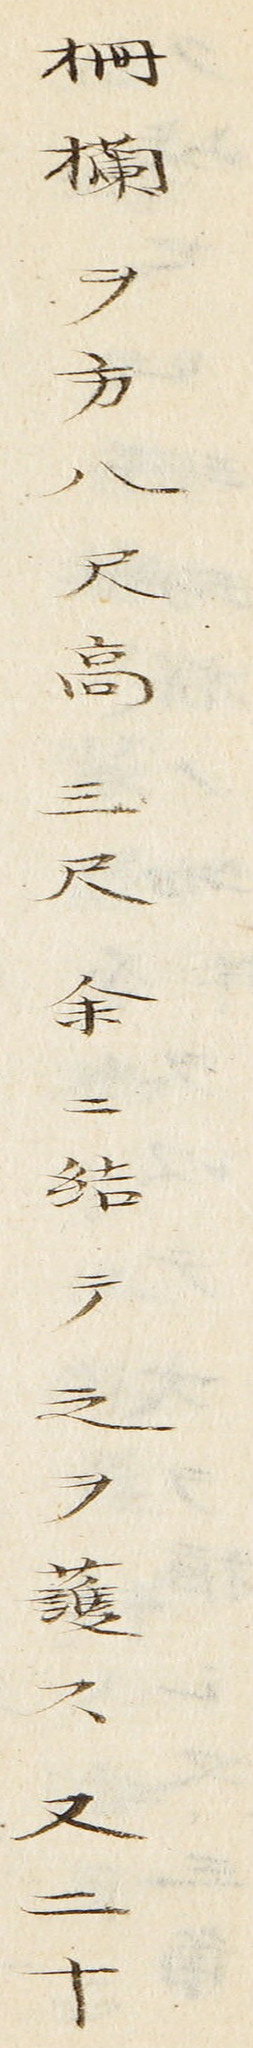柵欗ヲ方八尺高三尺余ニ結テ之ヲ護ス又二十
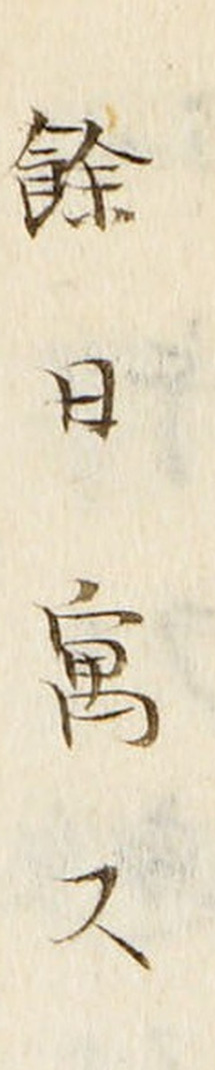余日寓ス
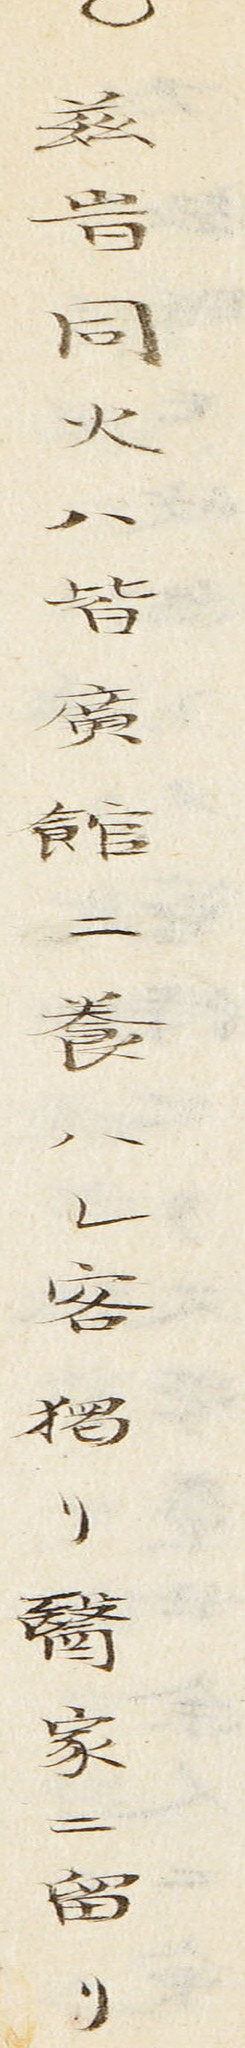○茲旹同火ハ皆広館ニ養ハレ客独リ医家ニ留リ
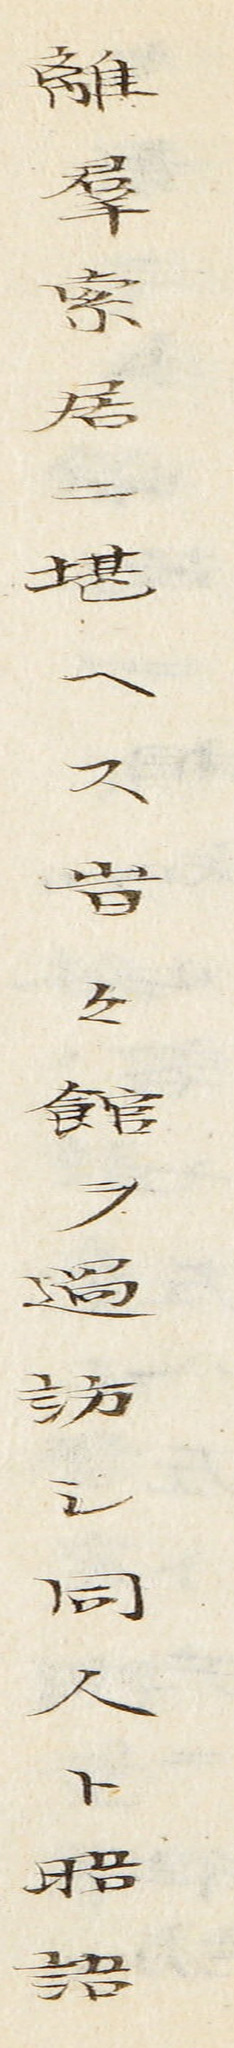離群索居ニ堪ヘス旹々館ヲ過訪シ同人ト晤語
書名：流蕃通書
